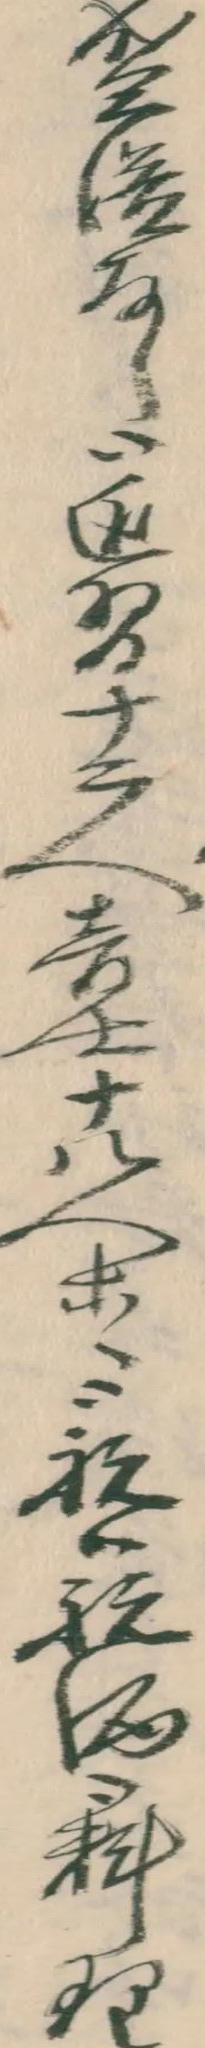盛後なし御近習十二人若士十八人等へ御祝御祝酒御料理
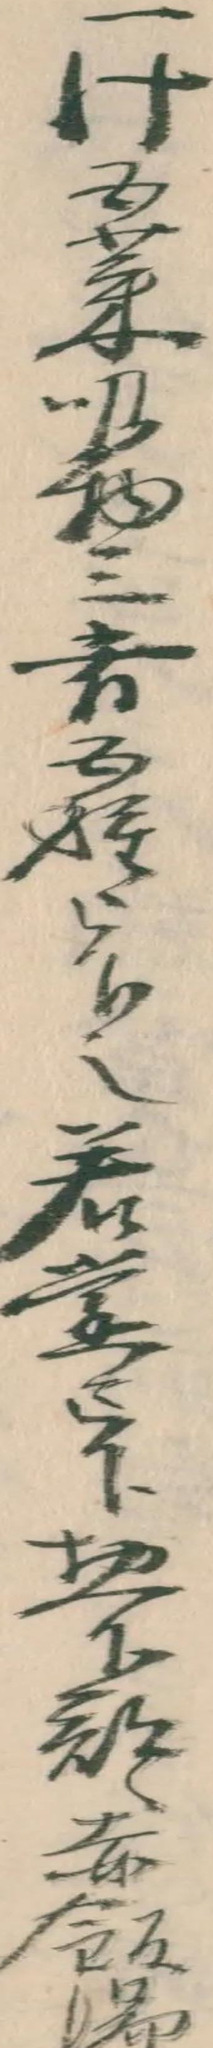一汁五菜吸物三肴五種被下也若党已下惣下部へ赤飯湯
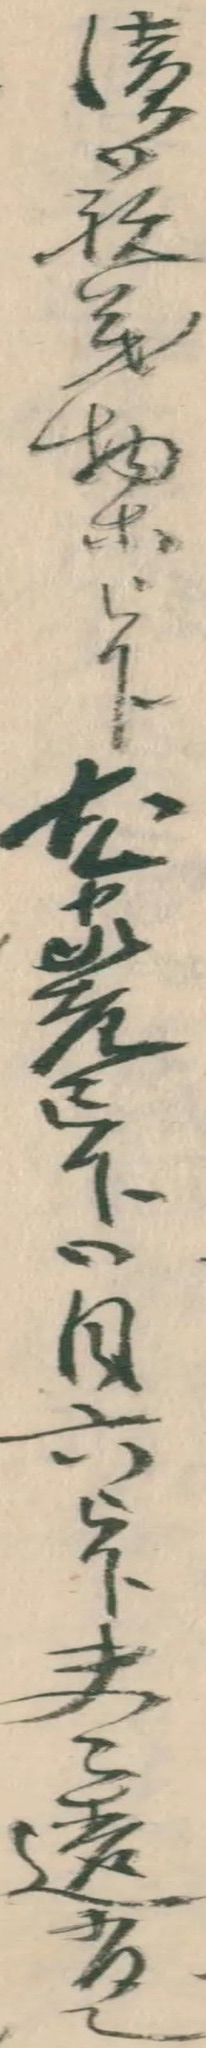潰御祝義物等被下尤家老已下御目六被下夫々違有之
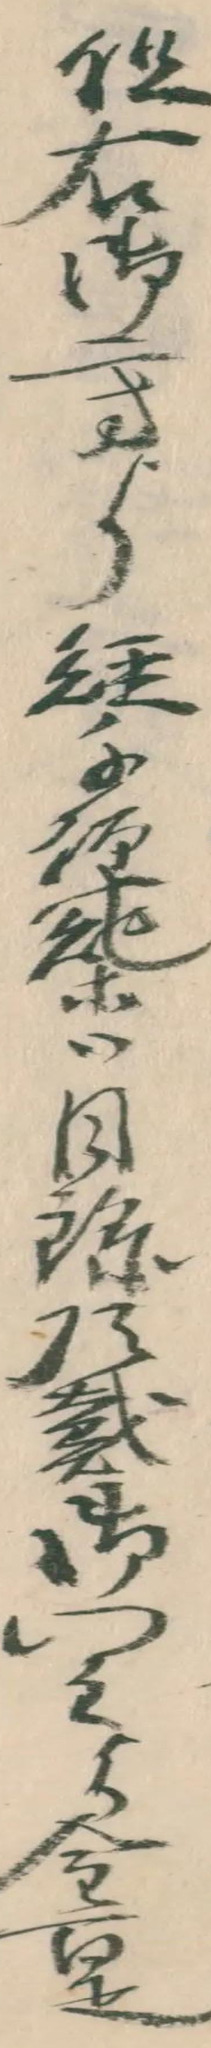但右御二方より経千経等御目録頂戴御門主より金百疋
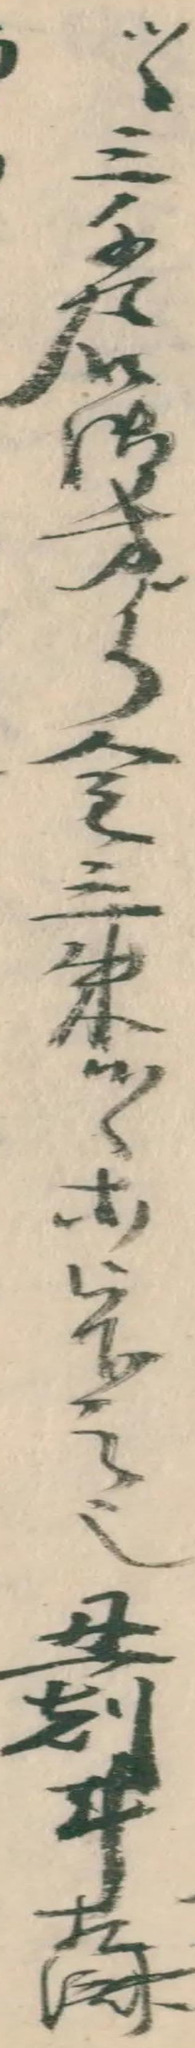ツヽ三千居御方より金三朱ツヽ等被下之也丑刻斗相済
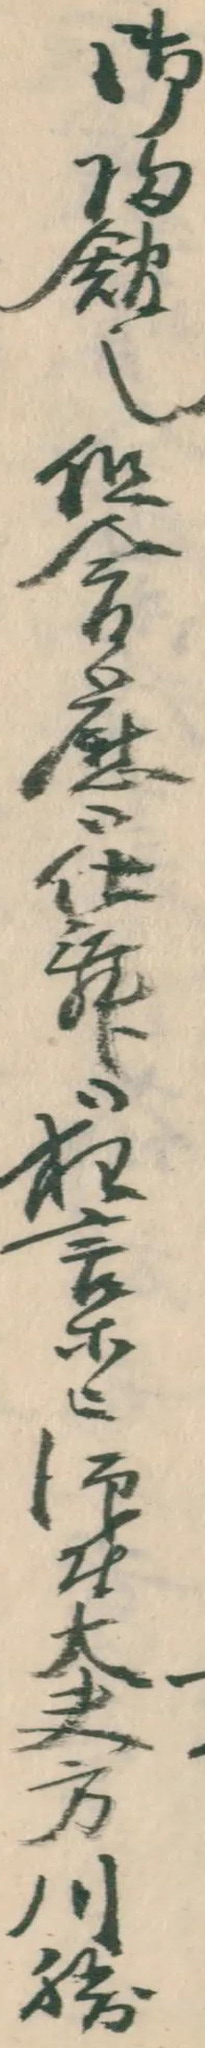御帰舘也但今日御慰御仕舞御狂言等被仰付大夫方川勝
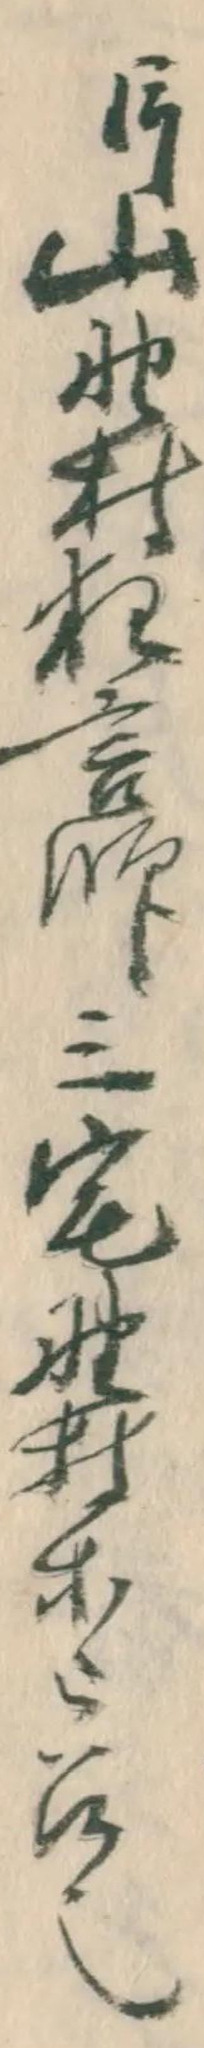片山野村狂言師三宅野村等被召也
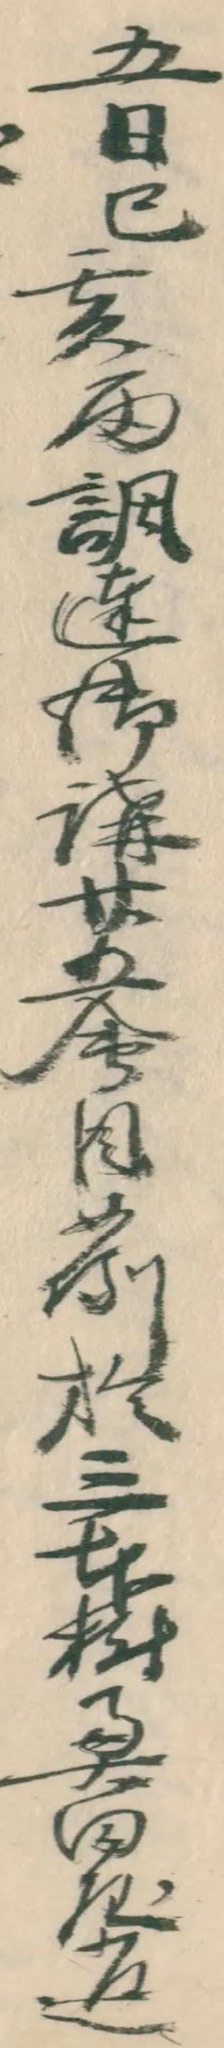五日己亥雨調達御講廿五會目如例於三本樹奥田屋有之
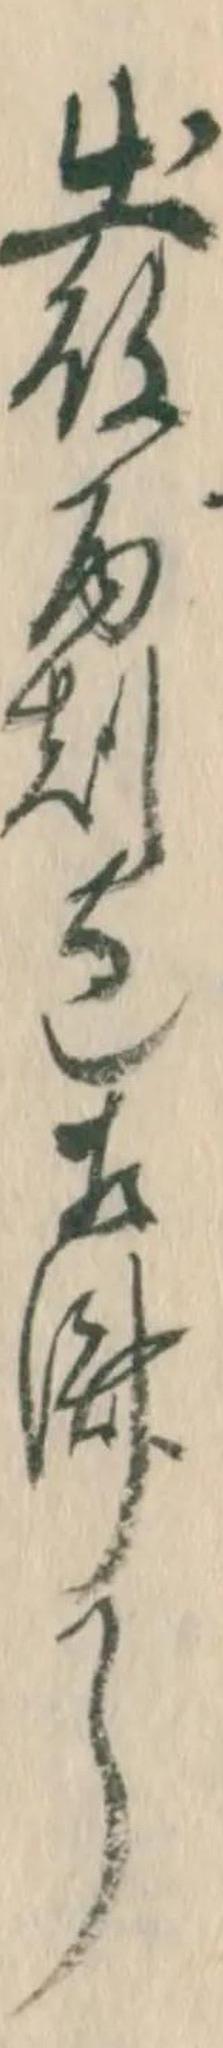出役酉刻過相済了
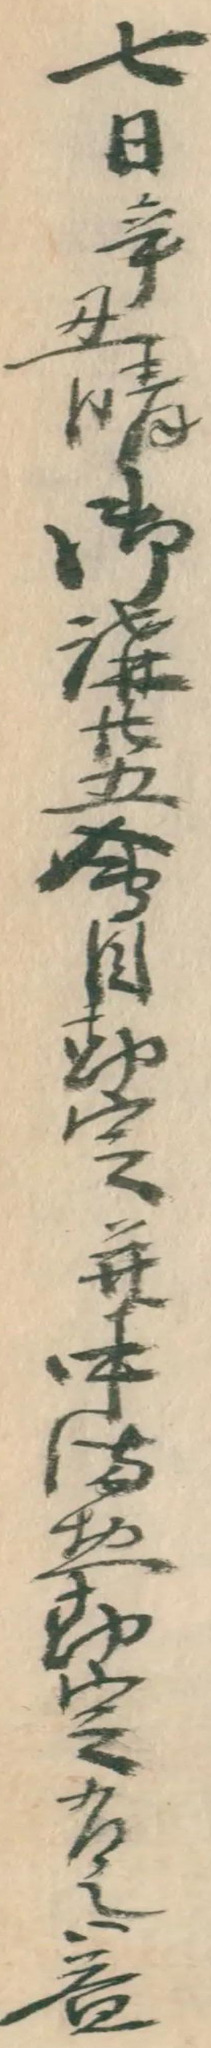七日辛丑晴御講廿五會目勘定并中満惣勘定有之御益

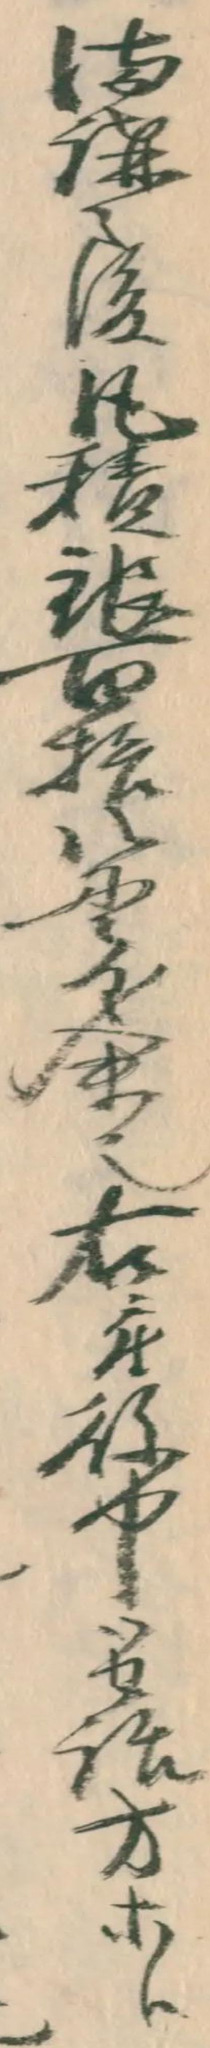満講之後凡積銀百拾八貫匁余也右ニ付役中御世話方等え
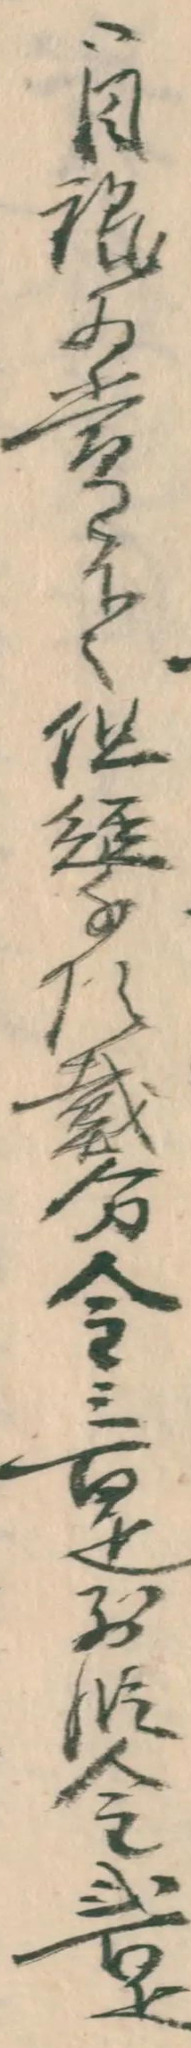御目録為賞被下也但経千頂戴分金三百疋別段金弐百疋
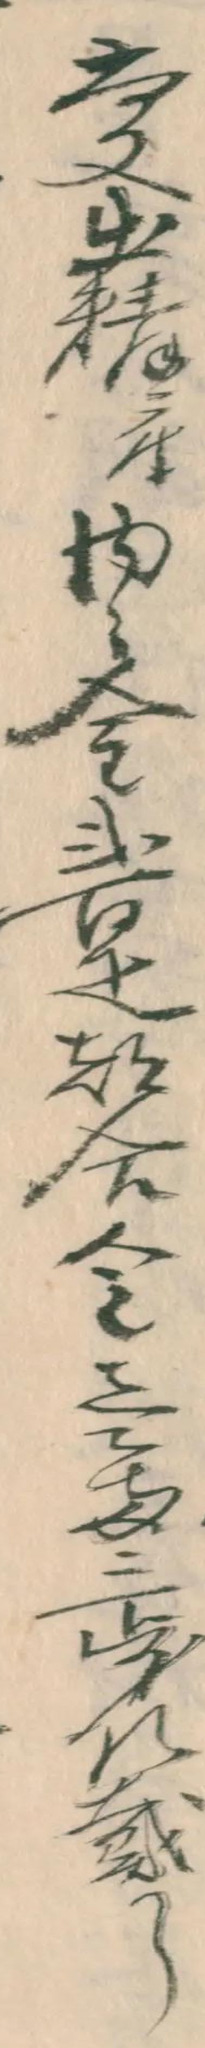尚又出精ニ付内々金弐百疋都合金壱両三歩頂戴了
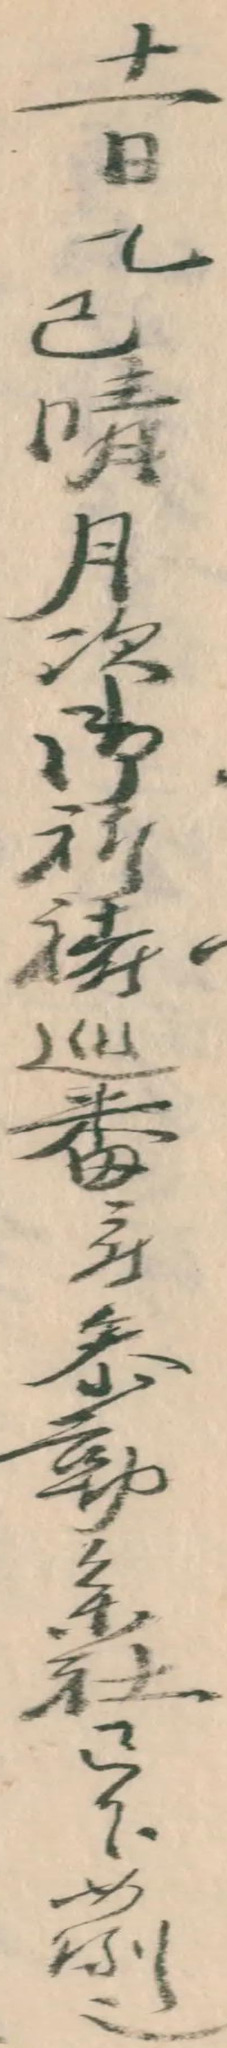十一日乙巳晴月次御祈祷巡番ニ付参勤参社已下如例也
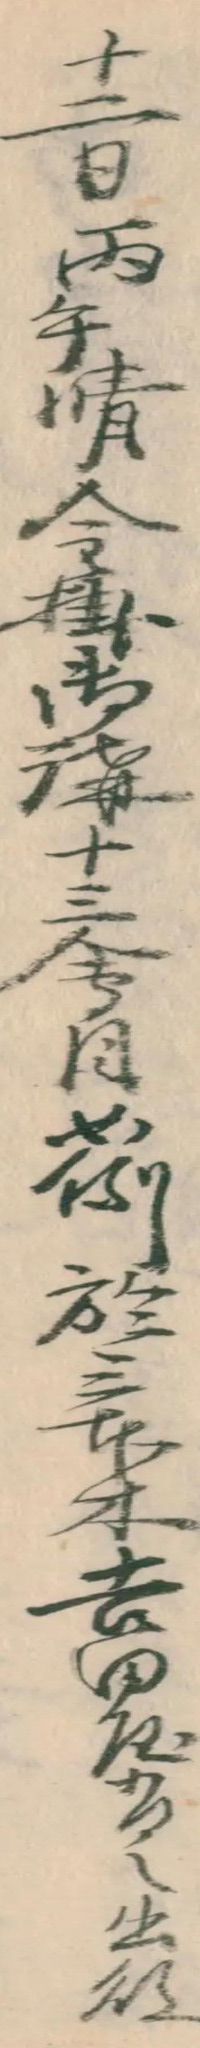十二日丙午晴金掛御講十三會目如例於三本木吉田屋有之出役
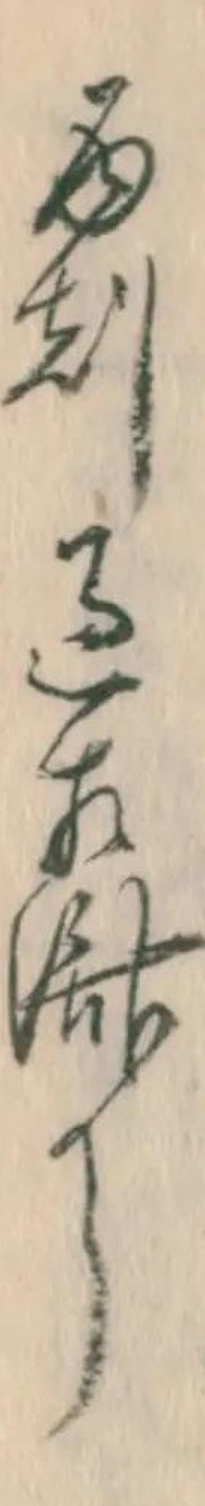酉刻過相済了
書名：賀茂社記録. 第66冊
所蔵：国立国会図書館 National Diet Library, JAPAN
